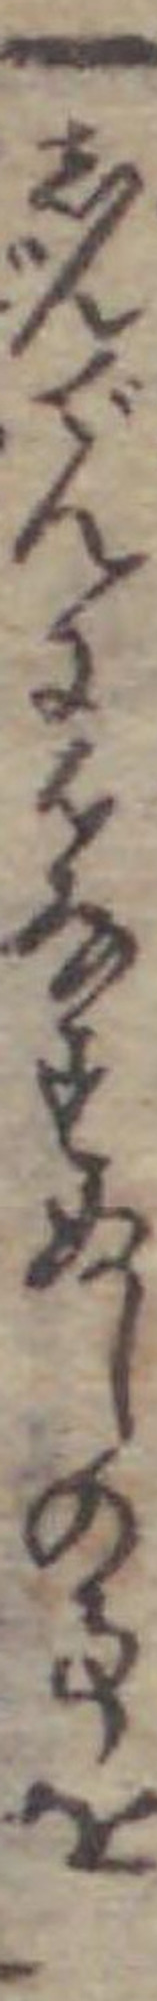しんでんにはなすぬしの事を
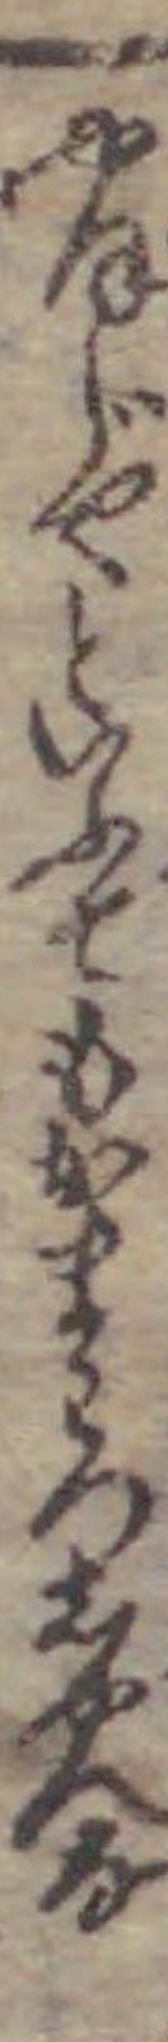やぼじやといふてもかまわしやんな
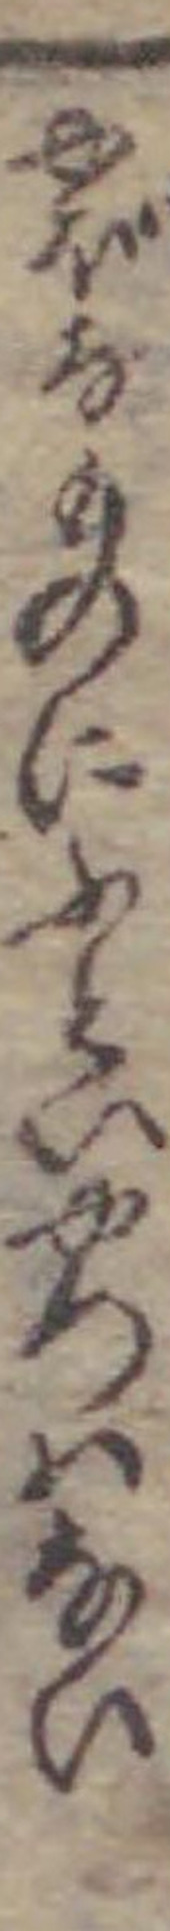やぼなものにふといやつはない
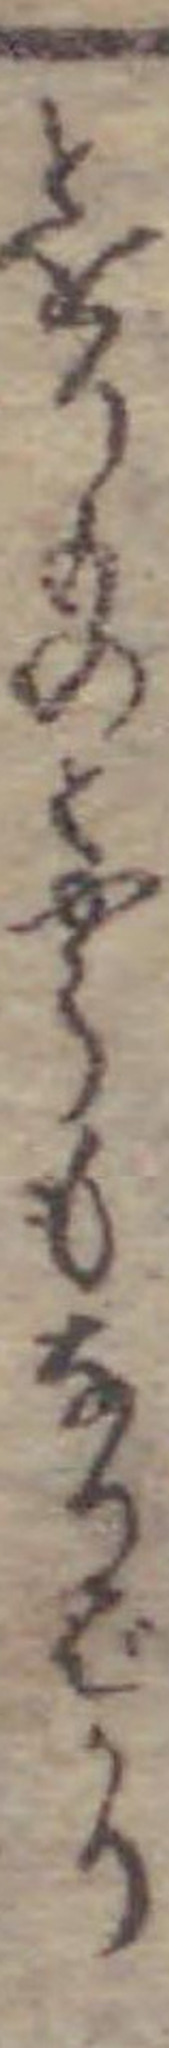とをりものとやらもなかばかり
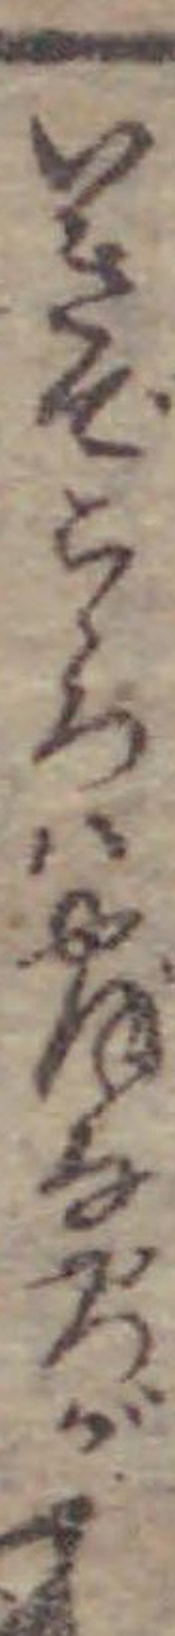いきでこゝろはやぼなやつが
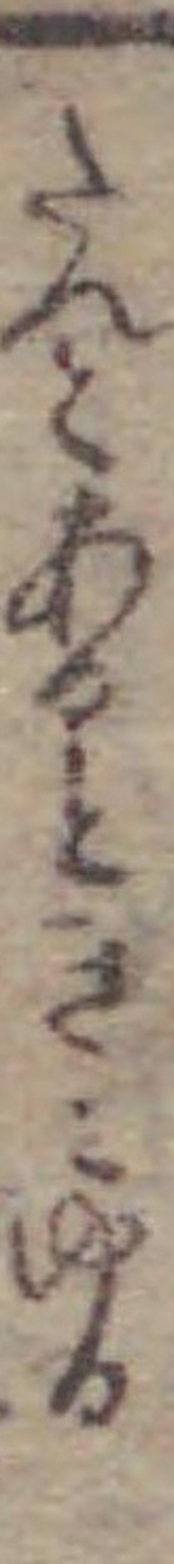たんとあるときこゆる
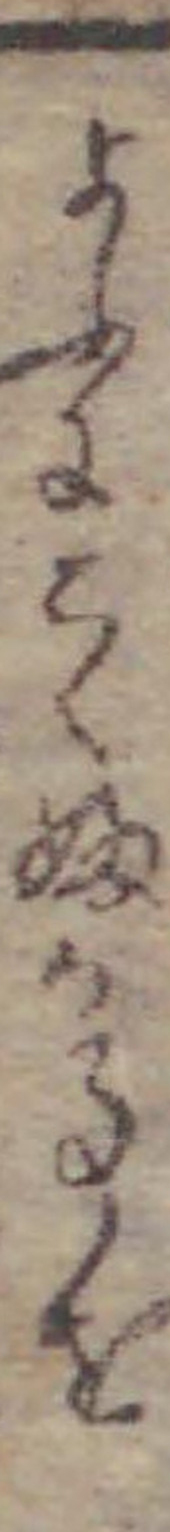やふにこくふか事を
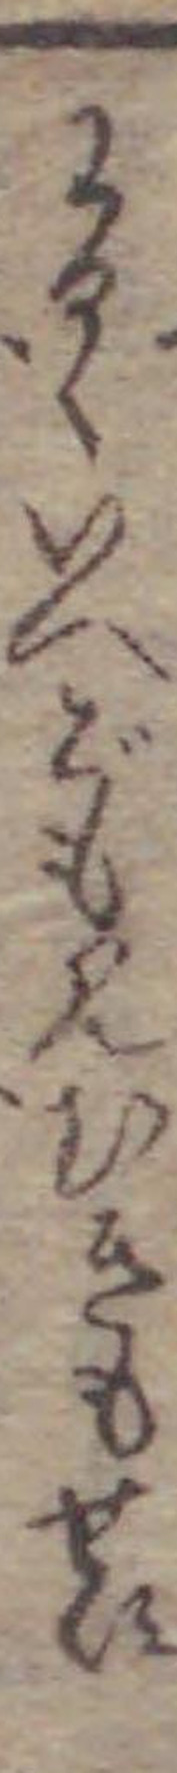わるくいへどもみひきもせす
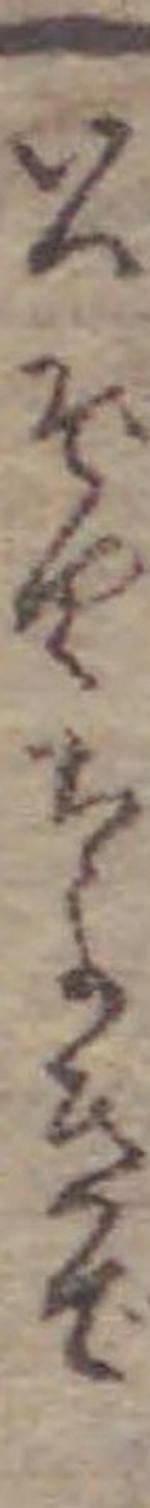とぞやちよきで
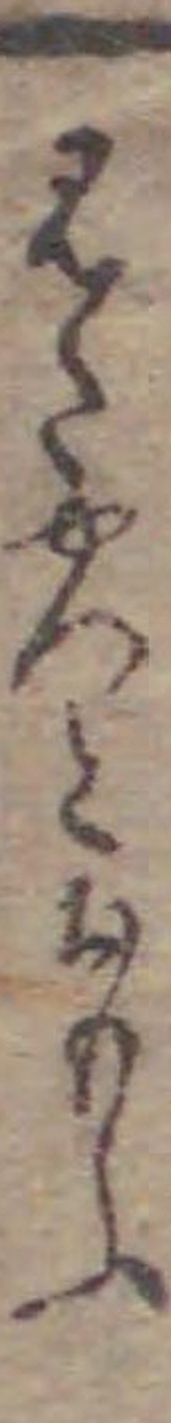見たやつとおもふ

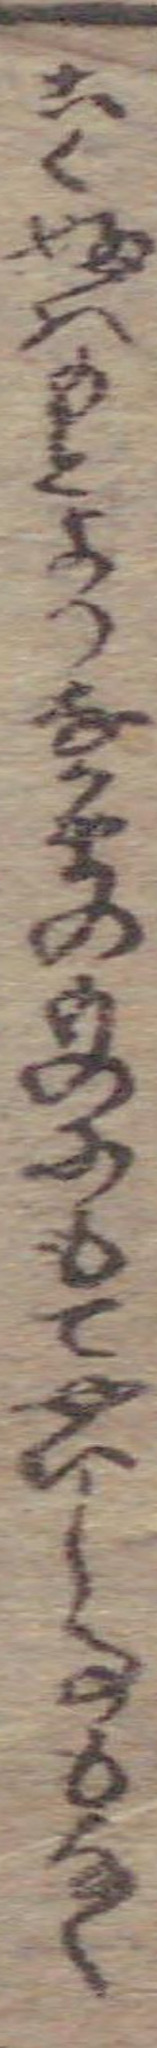こくふはもとよりなかまのものにもてやいし事もなく
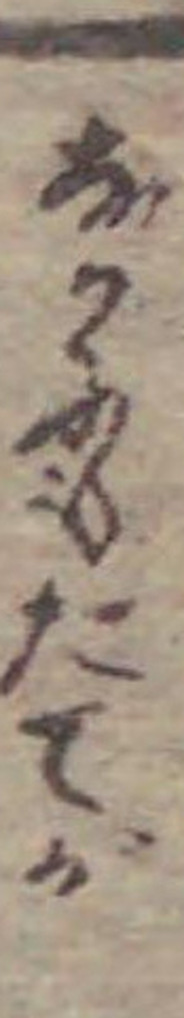なかにもたてが
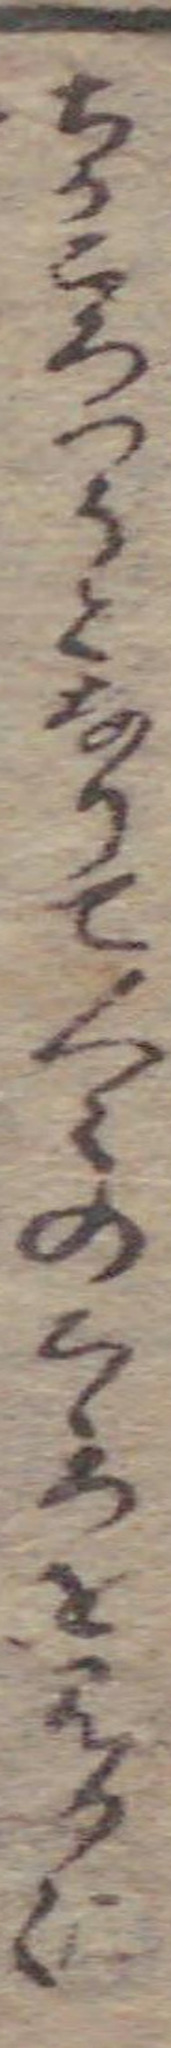ちかころつうとなりて人々のこゝろを見かに
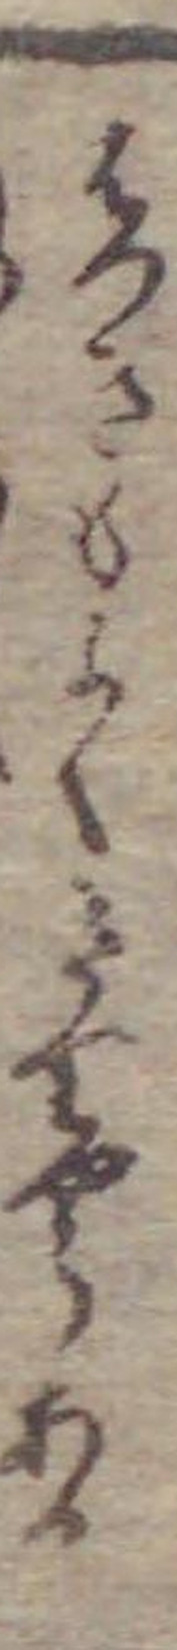はつきもよくたてやうある
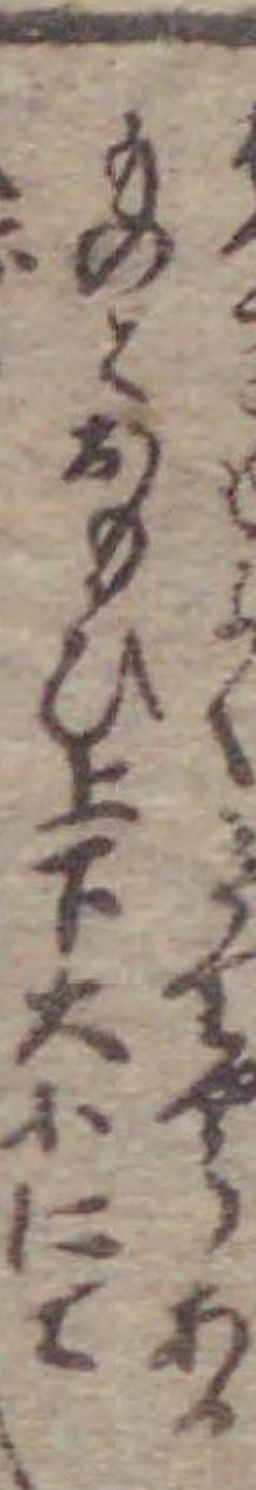ものとおもひ上下大小にて
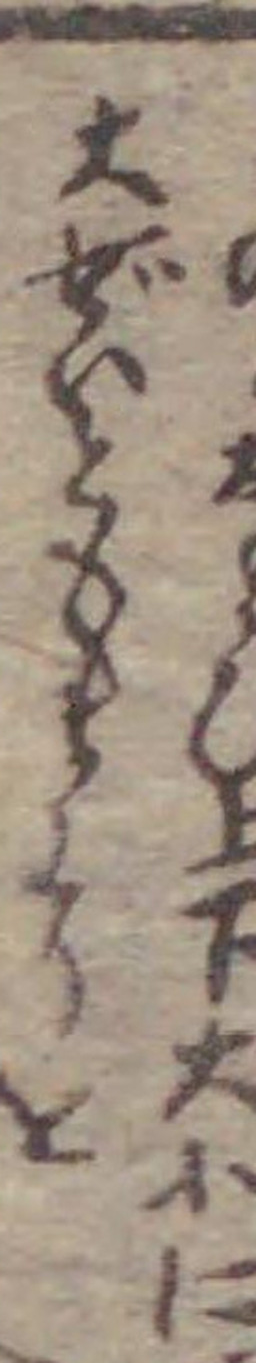大ぜいともまよりを
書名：談芭菰誉詞 : 3巻
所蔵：国立国会図書館 National Diet Library, JAPAN
